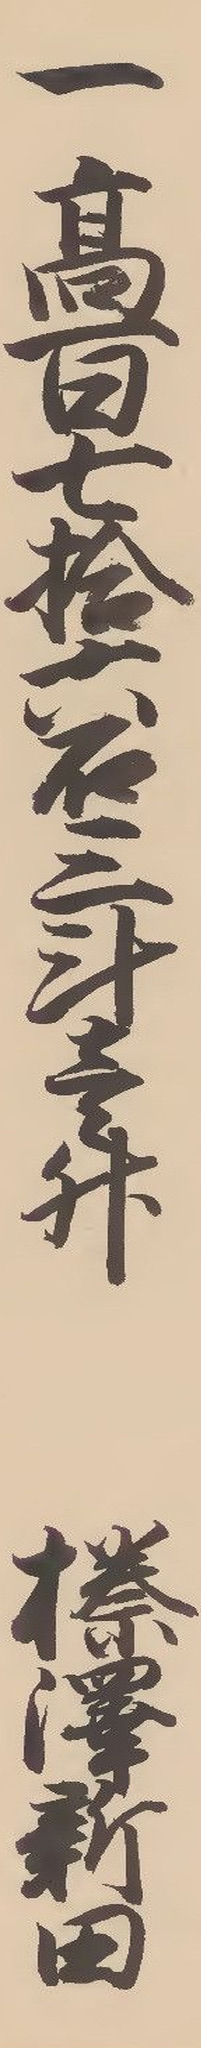一高百七拾六石三斗壱升榛澤新田

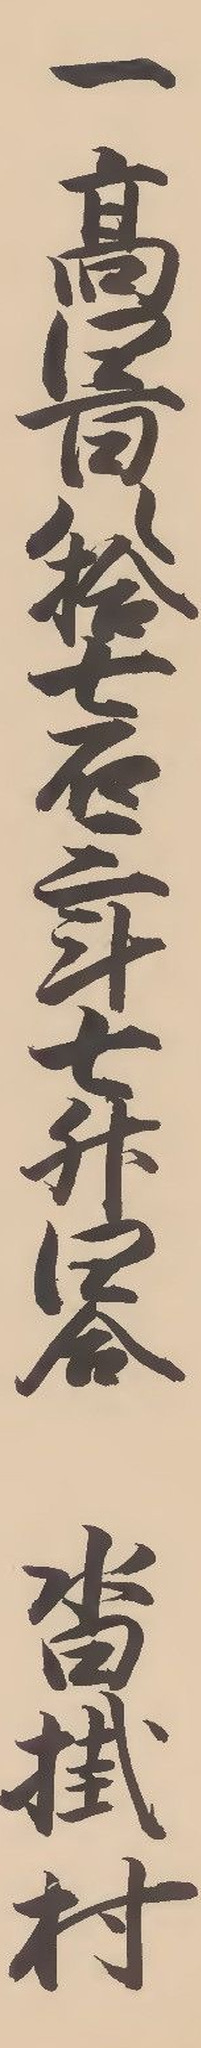一高四百八拾七石三斗七升四合沓掛村
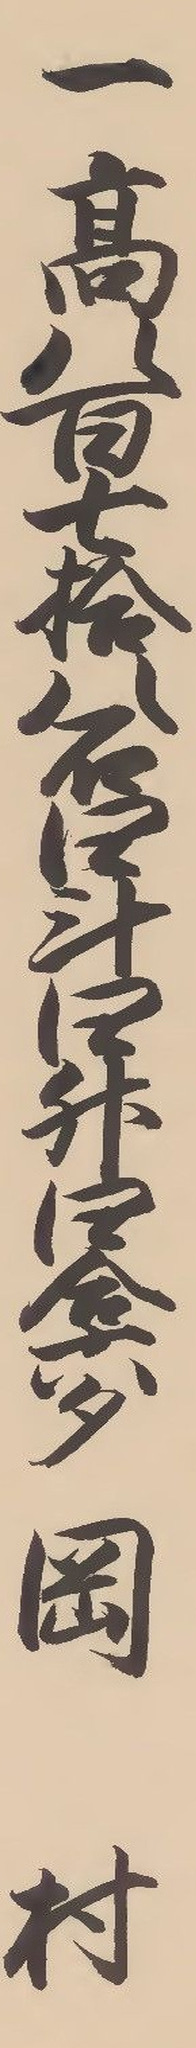一高八百七拾八石四斗四升四合六勺岡村
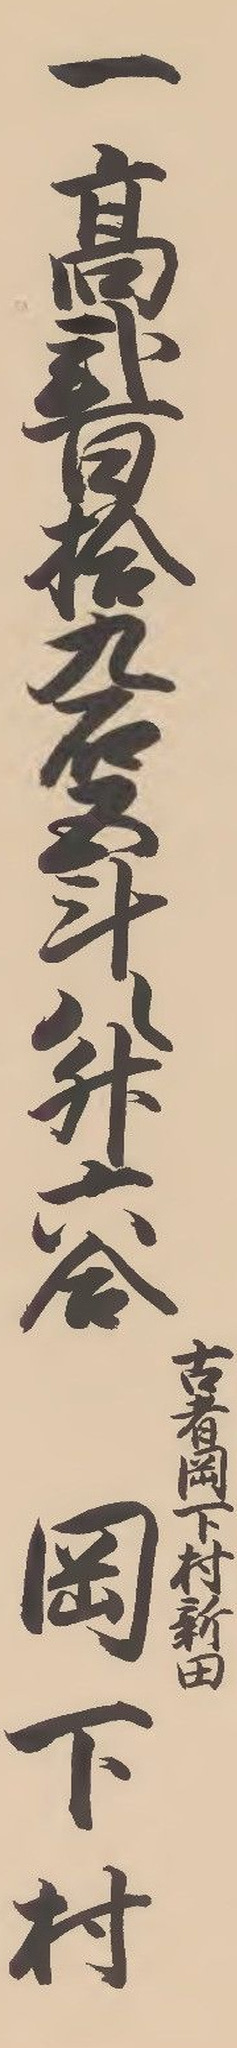一高弐百拾九石五斗八升六合岡下村
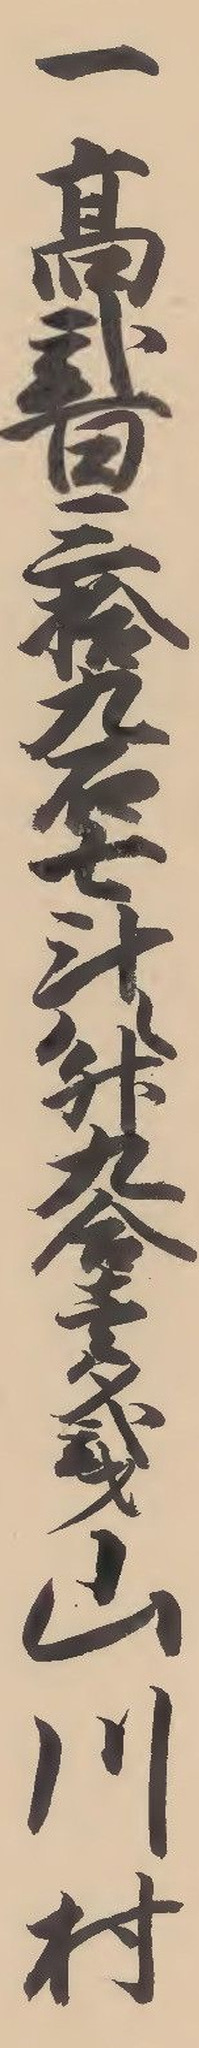一高弐百三拾九石七斗八升九合壱勺弐才山川村
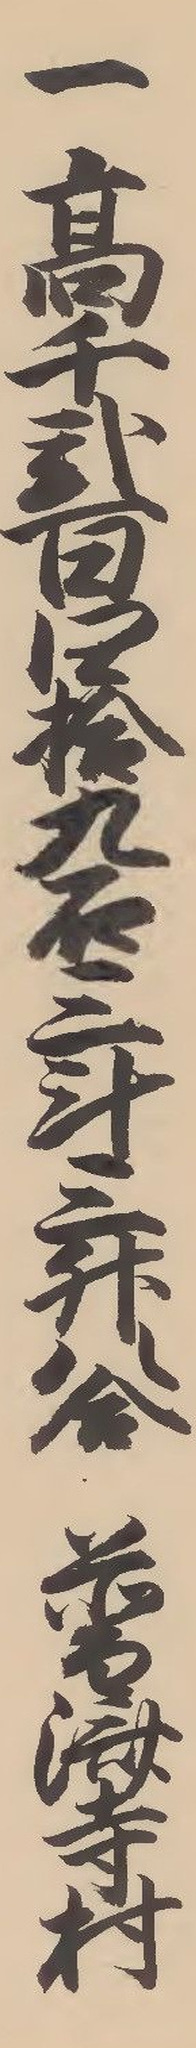一高千弐百四拾九石三斗三升八合普済寺村
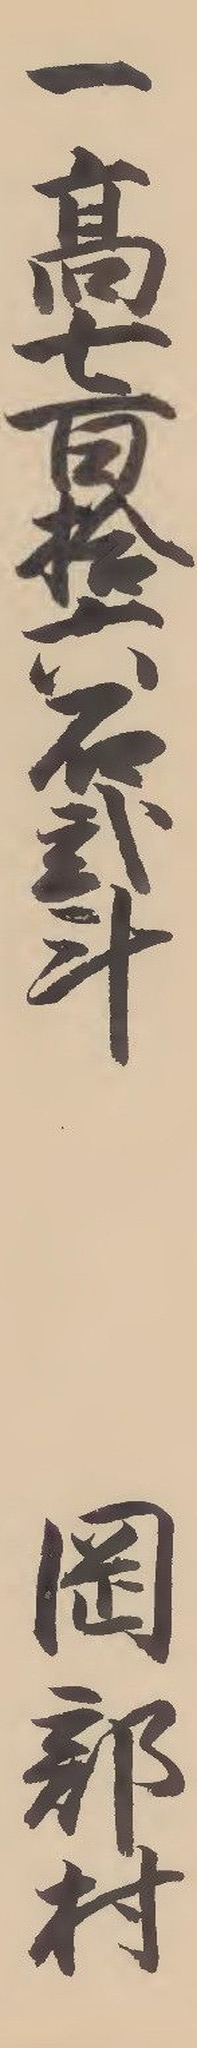一高七百拾六石弐斗岡部村
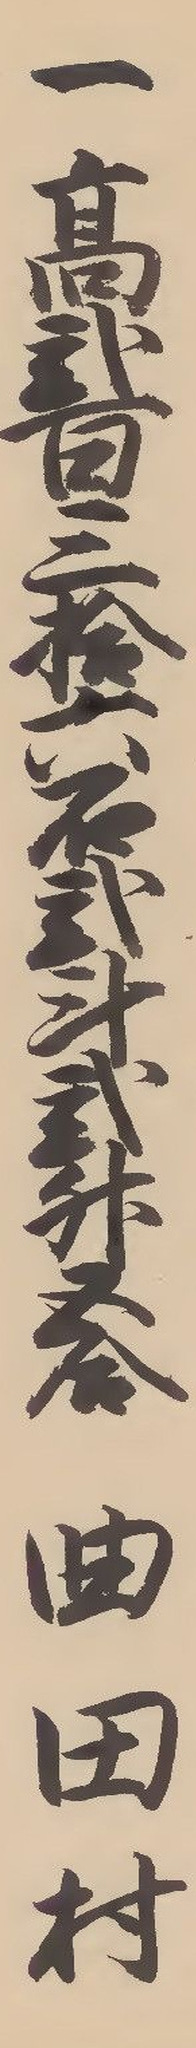一高弐百三拾六石弐斗弐升五合曲田村

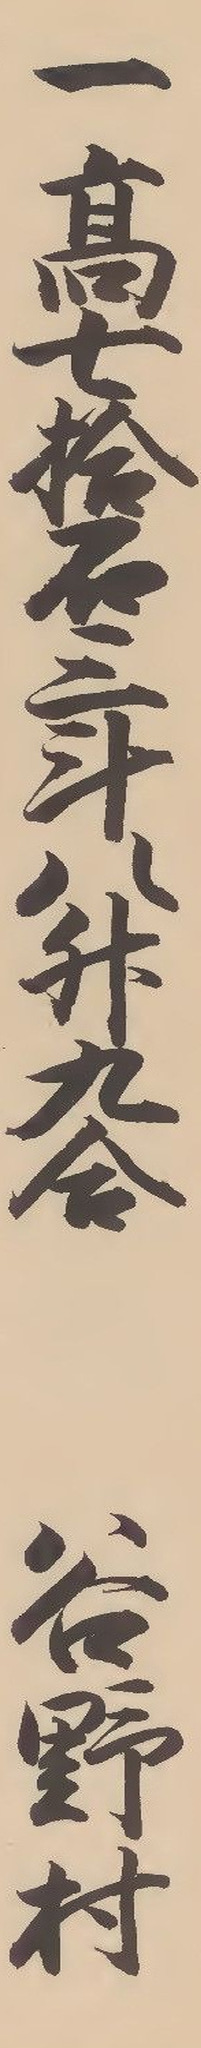一高七拾石三斗八升九合谷野村
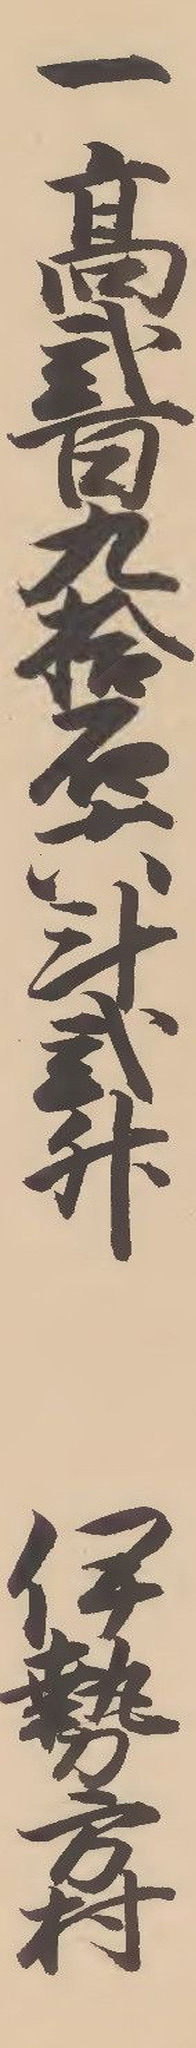一高弐百九拾石六斗弐升伊勢方村
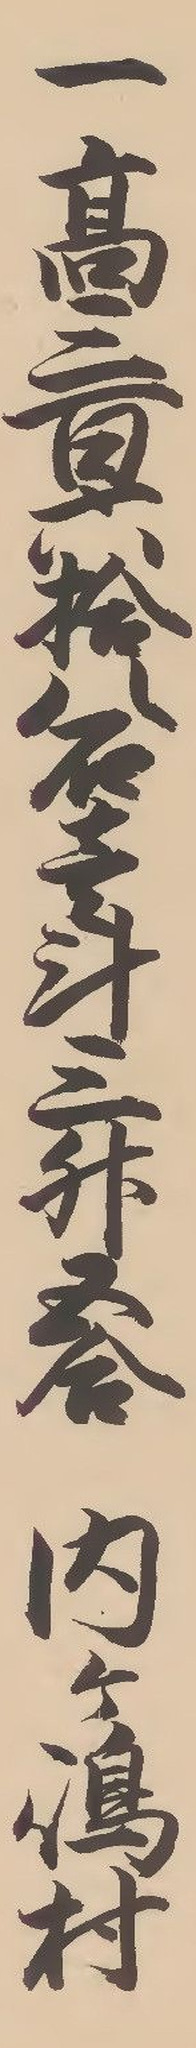一高三百六拾八石壱斗三升五合内ヶ嶋村
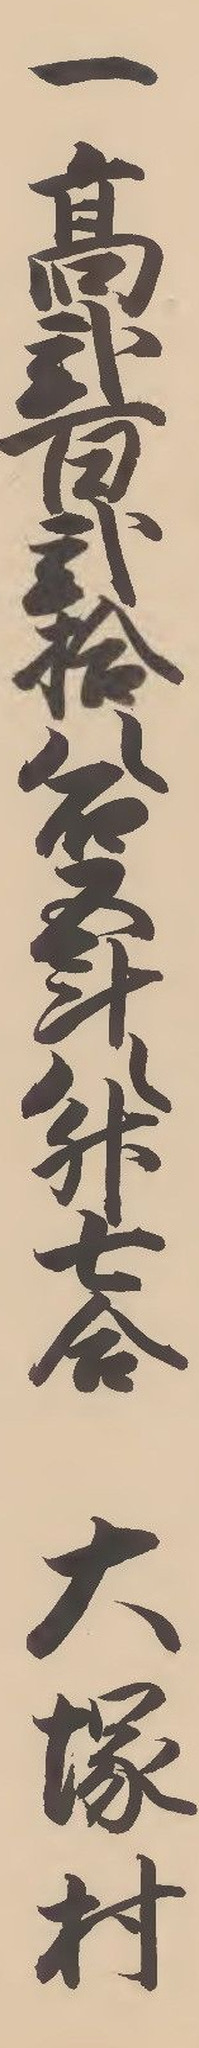一高弐百弐拾八石五斗八升七合大塚村
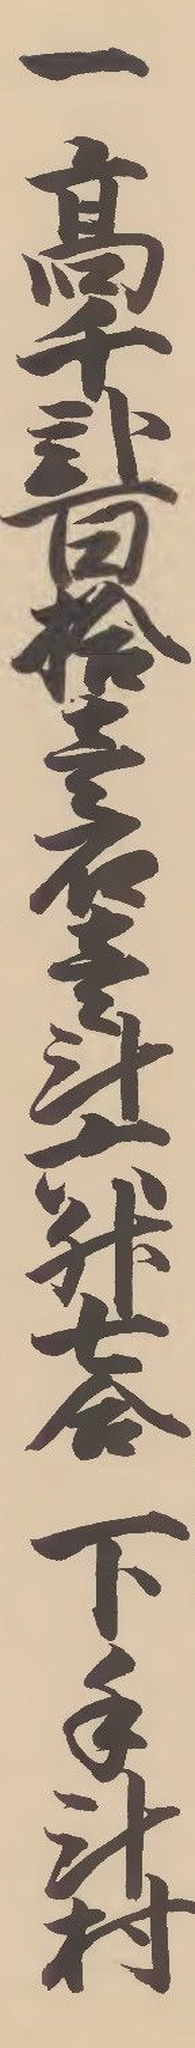一高千弐百拾壱石壱斗六升七合下手計村
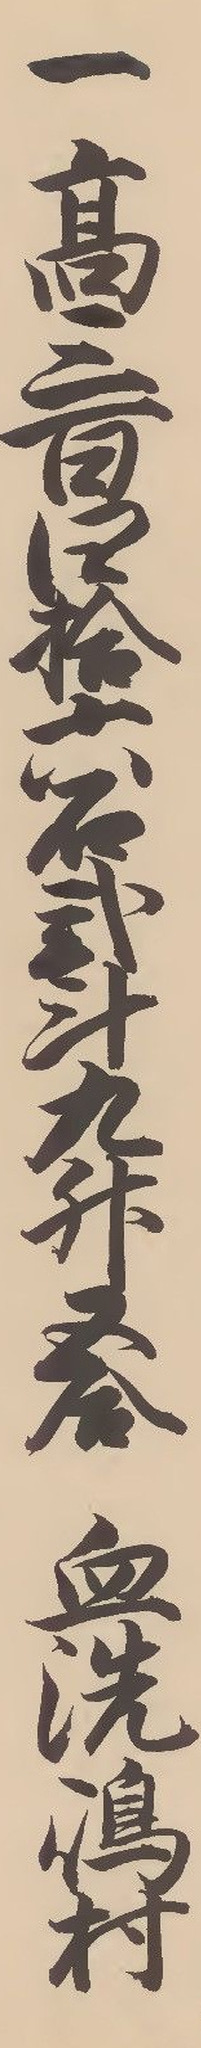一高三百四拾六石弐斗九升五合血洗嶋村
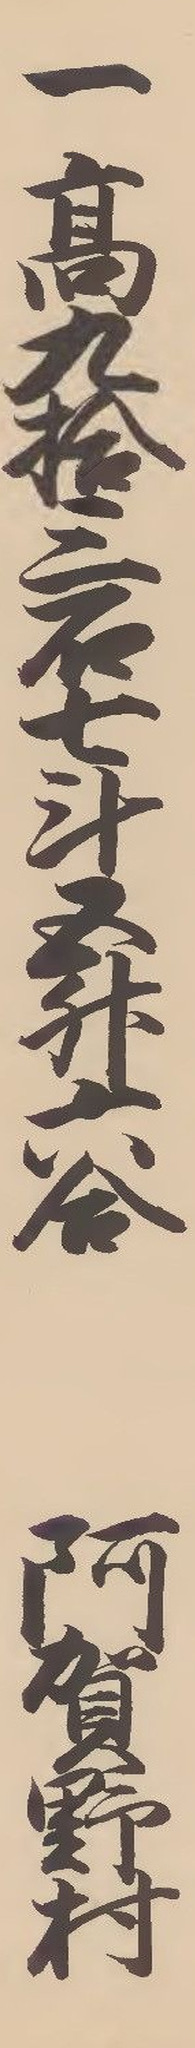一高九拾三石七斗五升六合阿賀野村

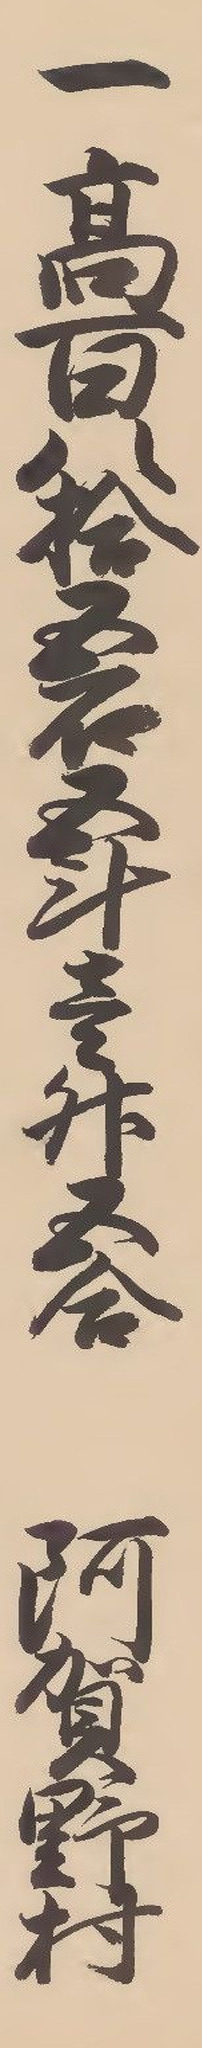一高百八拾五石五斗壱升五合阿賀野村
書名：武蔵国郷帳　下
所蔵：国立公文書館 National Archives of Japan
